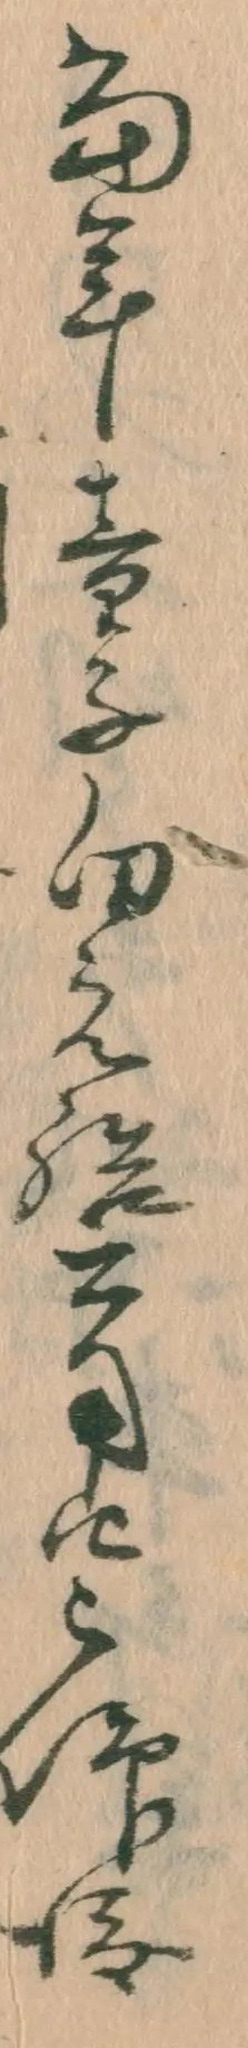当年童子白元結可用由被仰渡
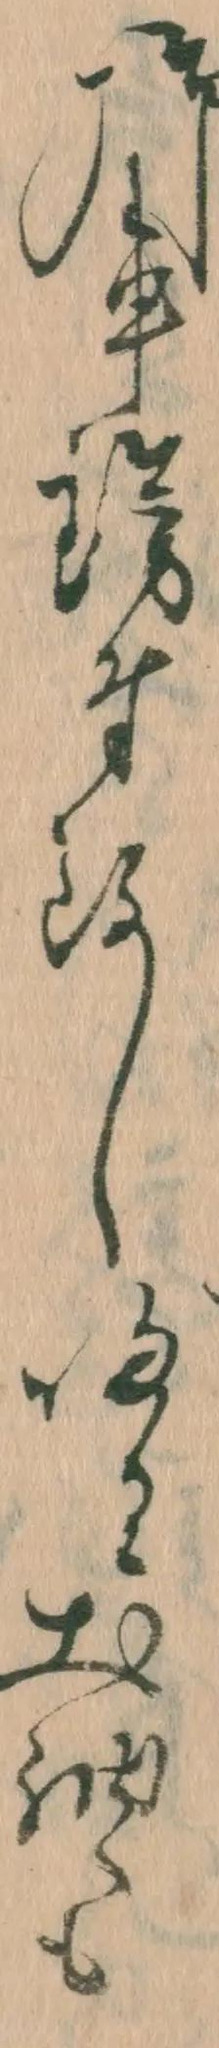御車餝付致し帰りニ出納へも
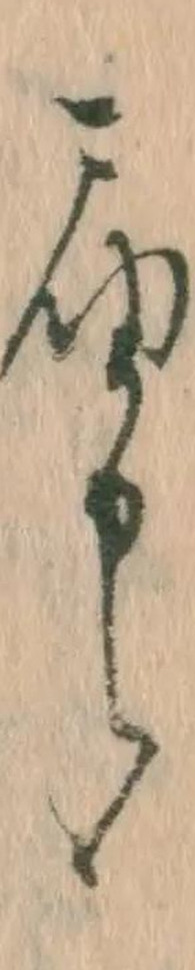届申候
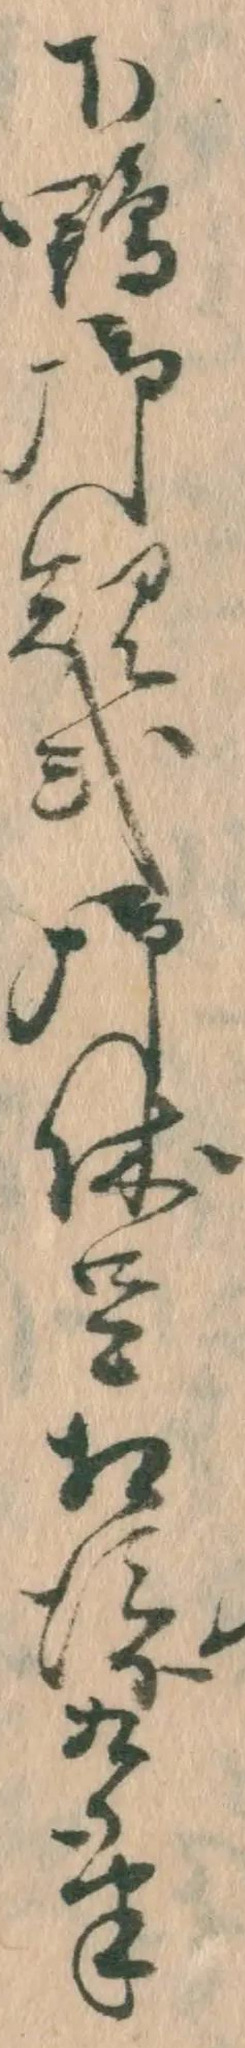下鴨御規式御休足相済九ツ半
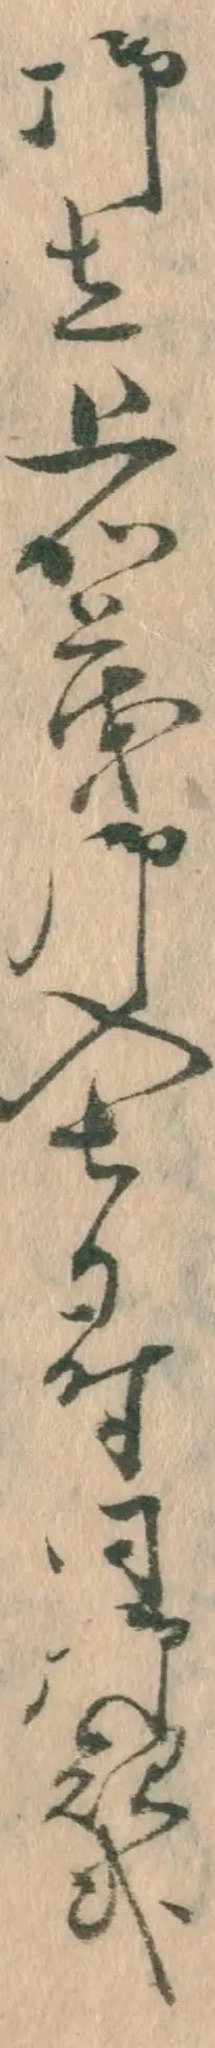御立上加茂御入七ツ時同御規式
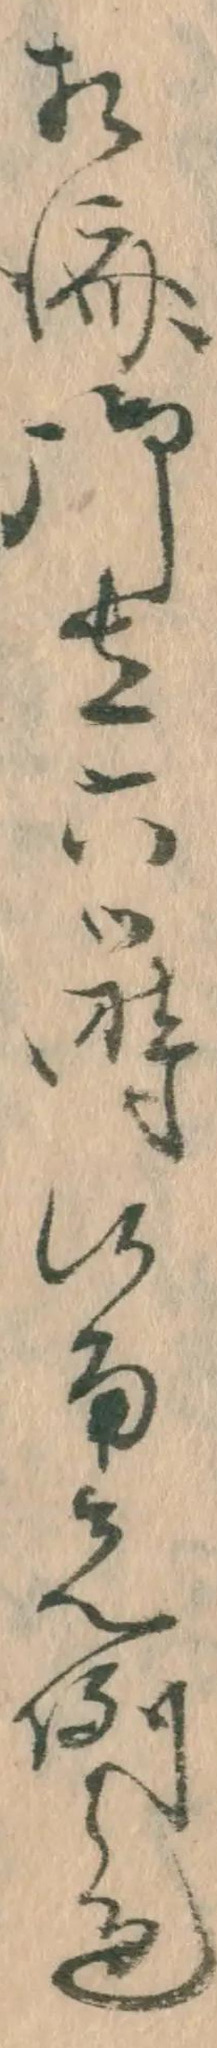相済御立六ツ時何角先例之通

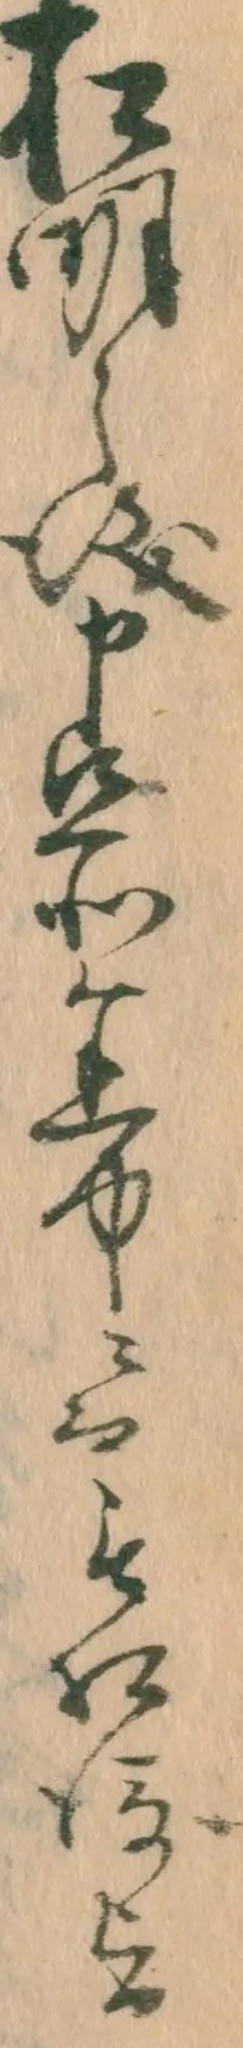松明之儀申候所途中ニ而相渡旨
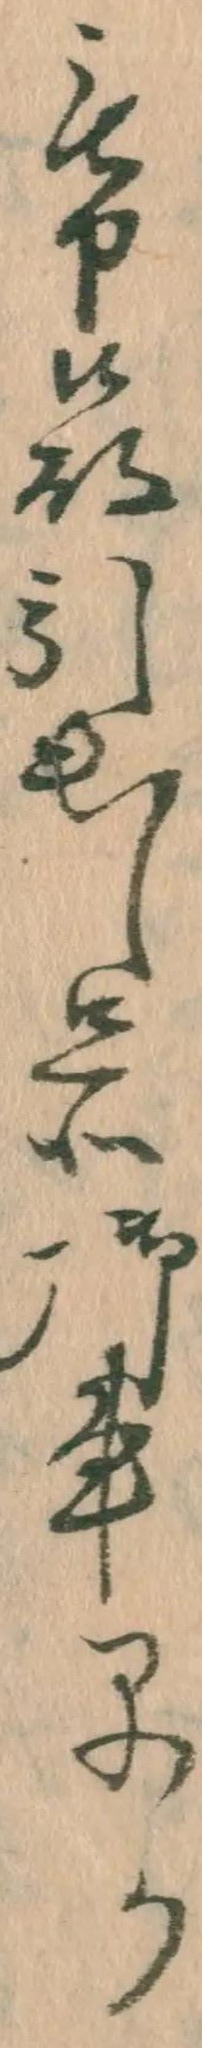被申候故引出し候所御車早ク
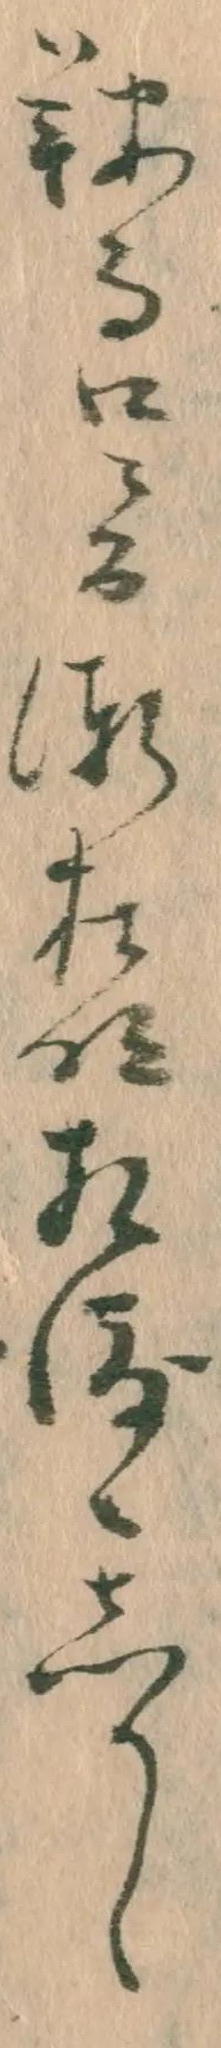鞍馬口ニ而漸松明相渡候しかし
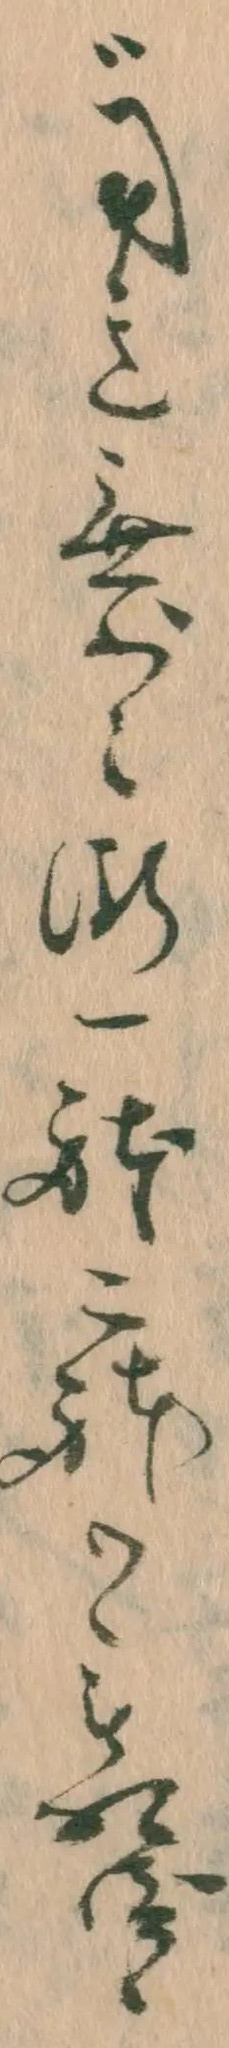御用意無少々漸一体二体ツヽ被相渡候
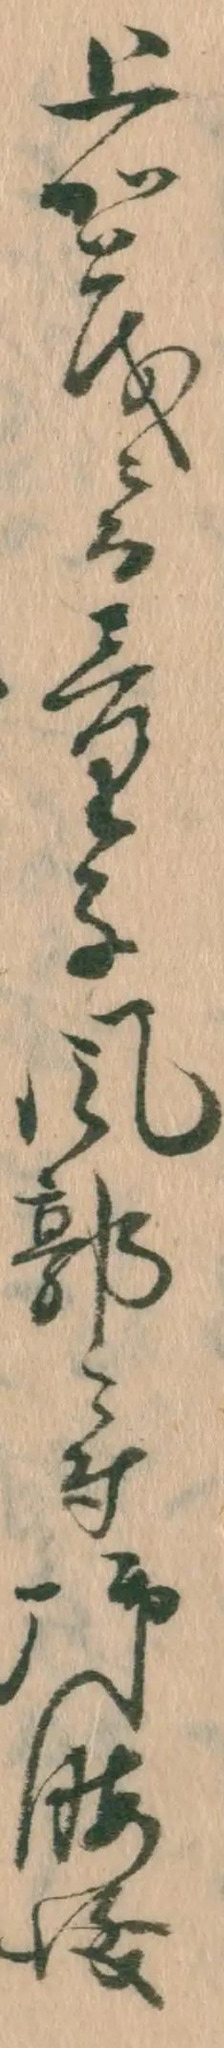上加茂ニ而童子風郭ニ付御暇儀
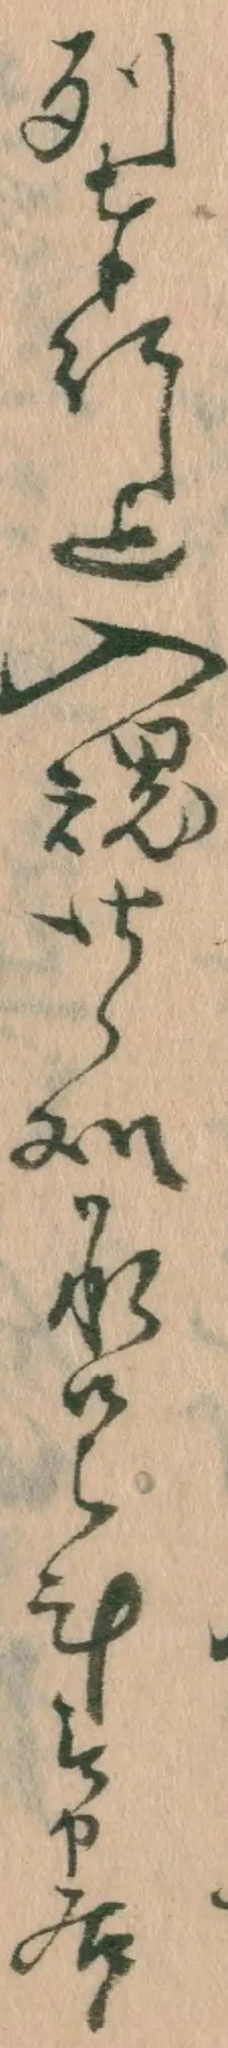列奉行迄入魂仕候処承候と計被申居候
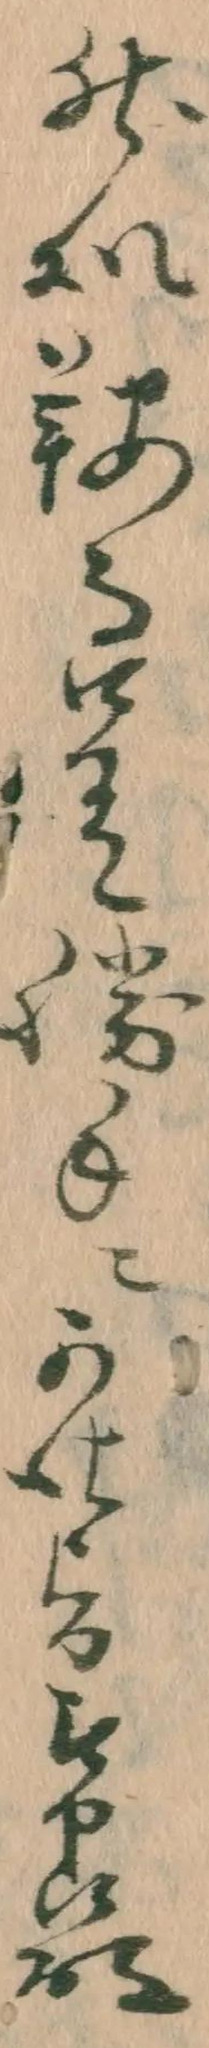然処鞍馬口にて勝手ニ可仕旨被申候故
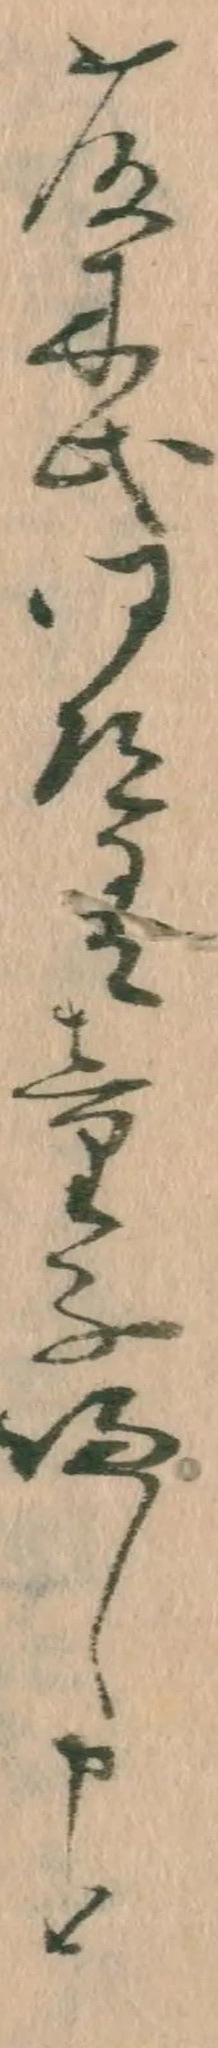藤木氏同道にて童子帰し申候
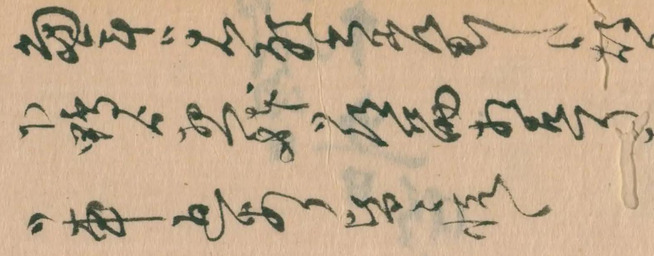下鴨ゟ惣体御道筋相直り甚
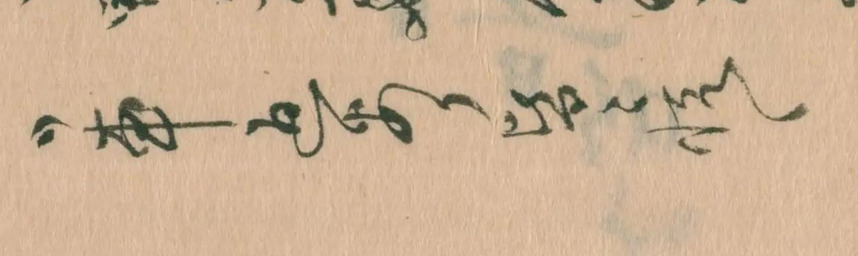御車通安ク皆々悦候
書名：賀茂社記録. 第61冊
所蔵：国立国会図書館 National Diet Library, JAPAN
